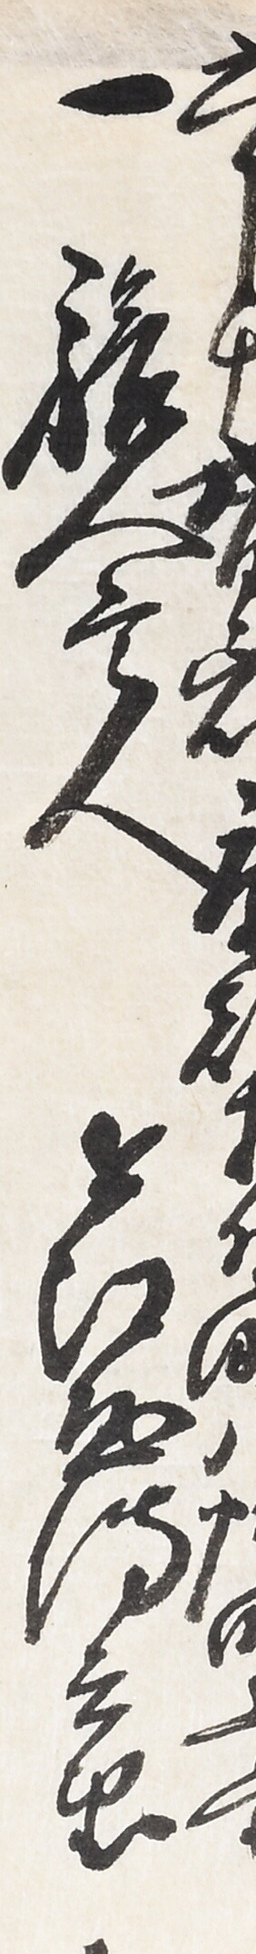一旅人壱人近江屋伝兵衛
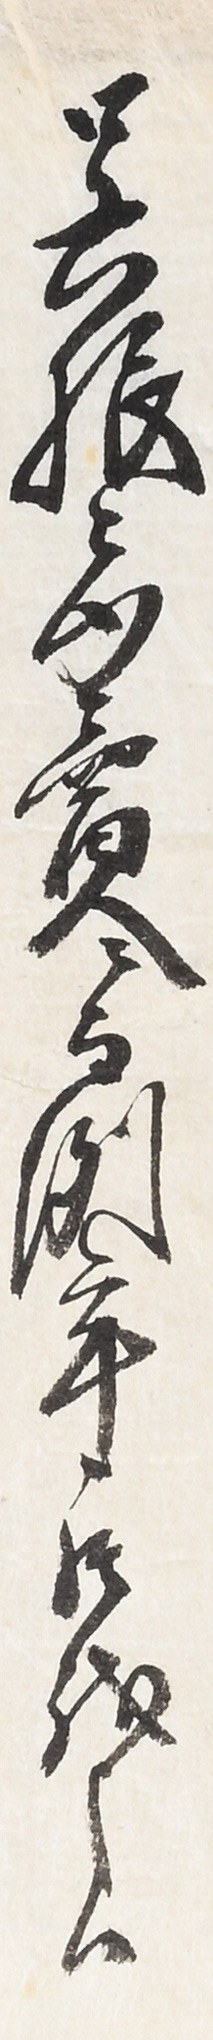呉服商売ニ而例年罷越申候
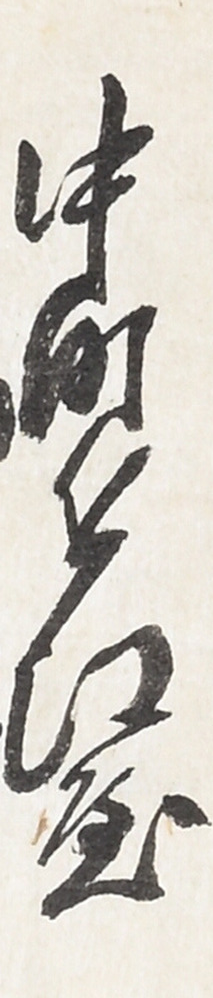中町近江屋
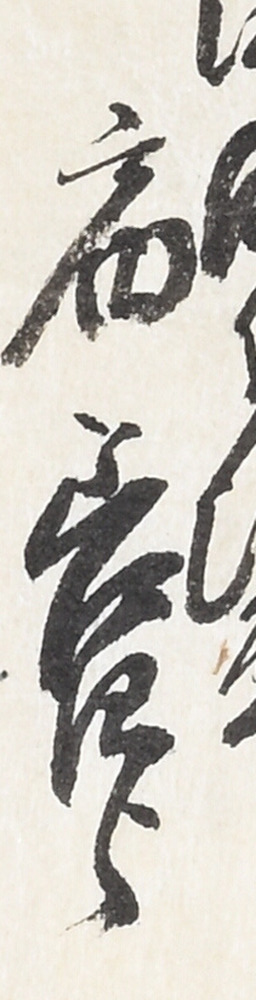宿善四郎
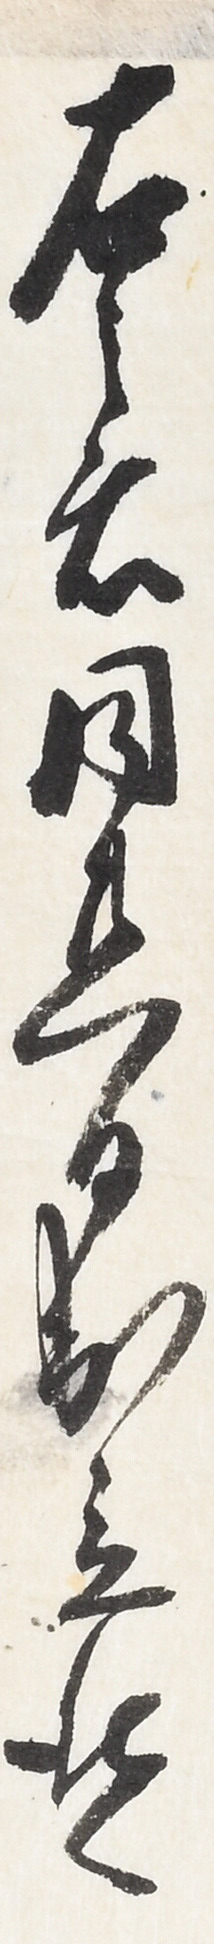右之者同廿一日出立仕候
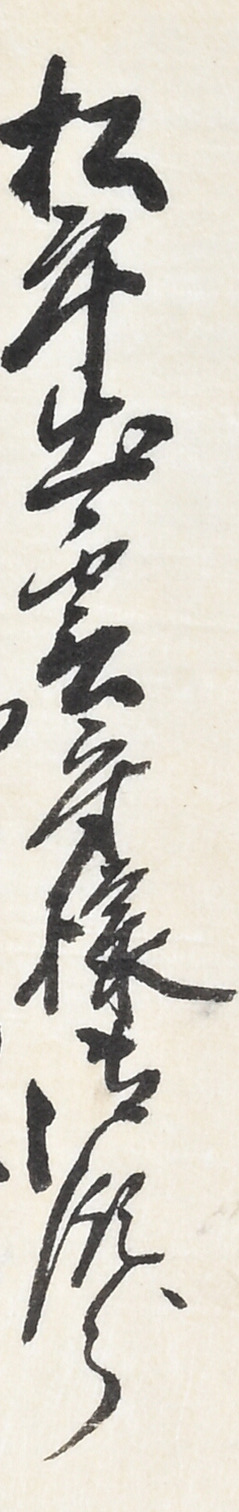松平出雲守様御領分
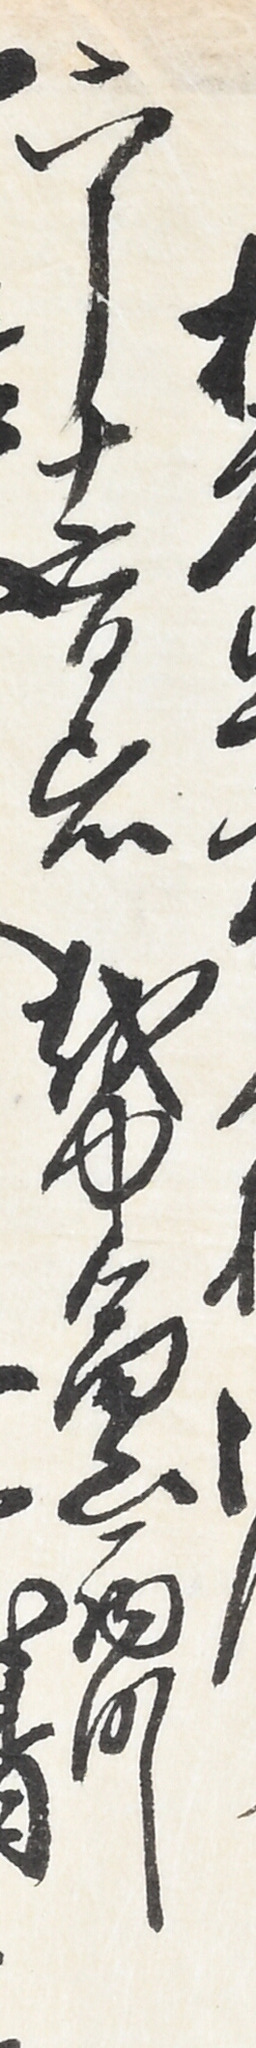六月十六日着越中富山西町
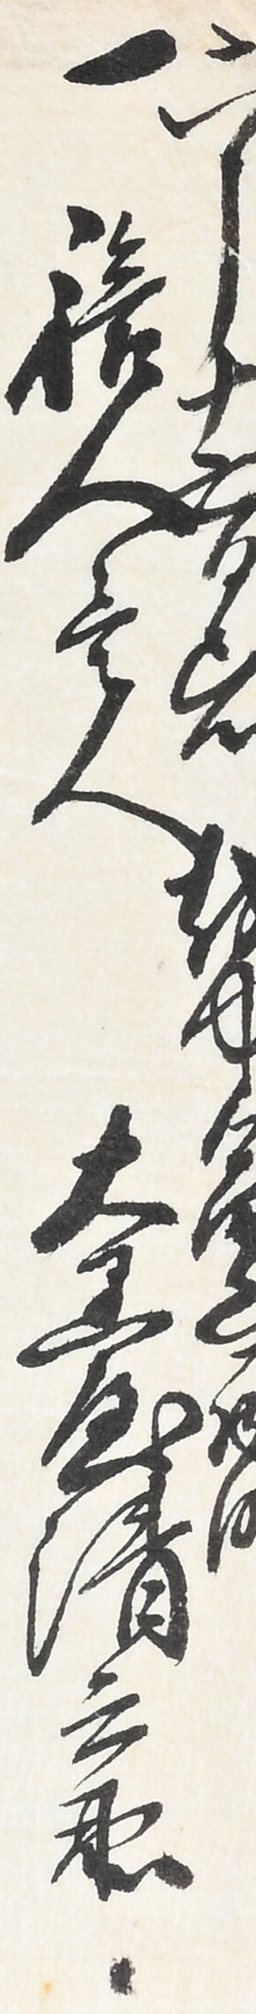一旅人壱人大黒屋清兵衛・
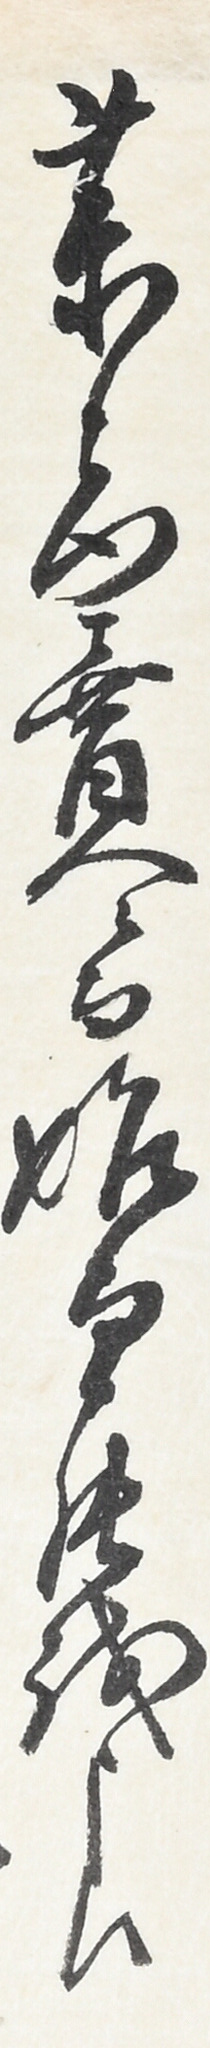茶商売ニ而始而罷越申候
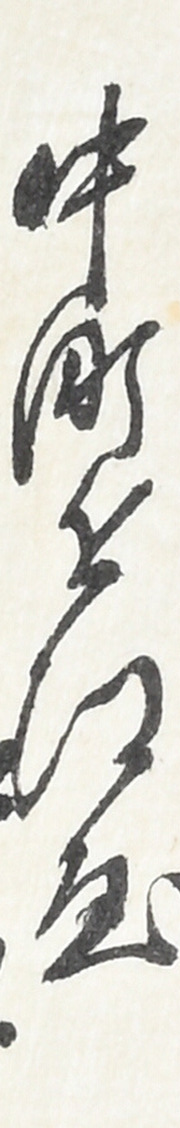中町近江屋
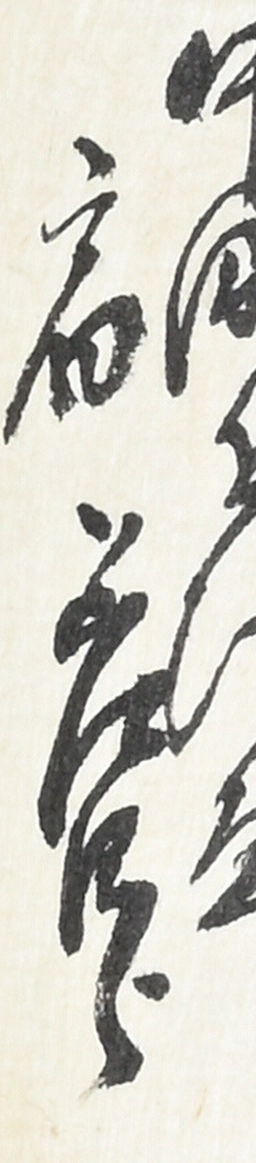宿善四郎
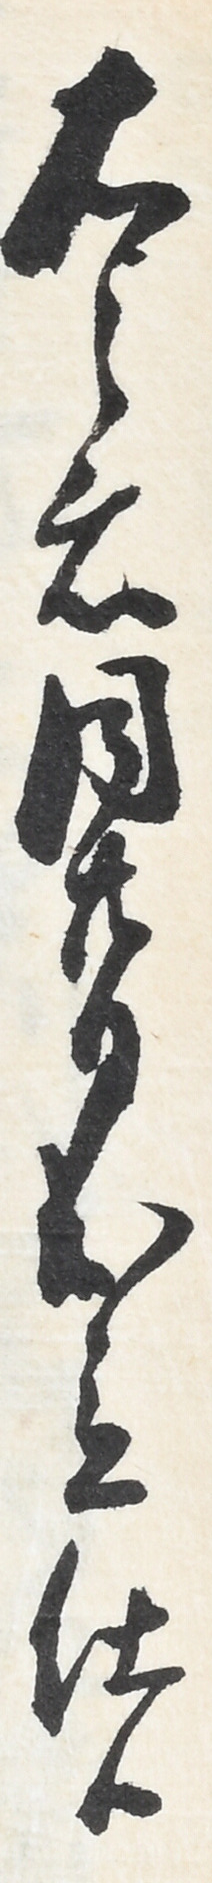右之者同廿一日出立仕候
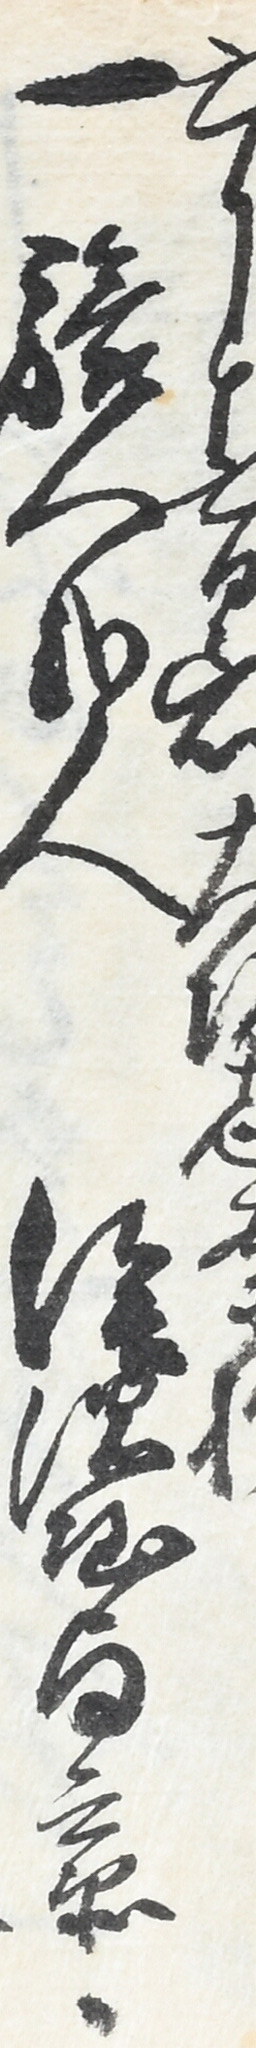一旅人壱人近江屋伝兵衛

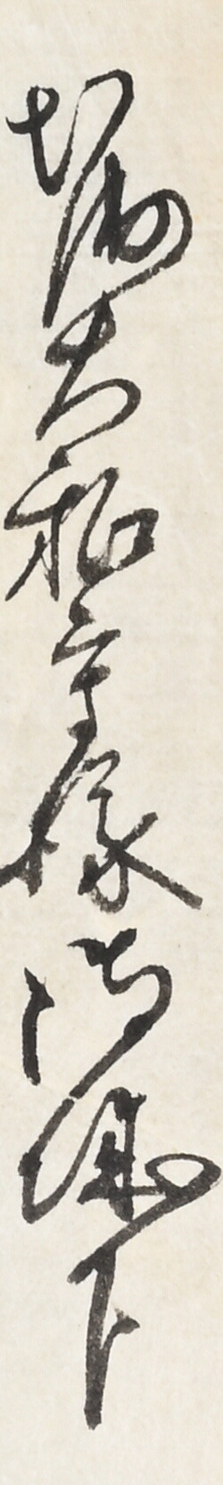堀大和守様御城下
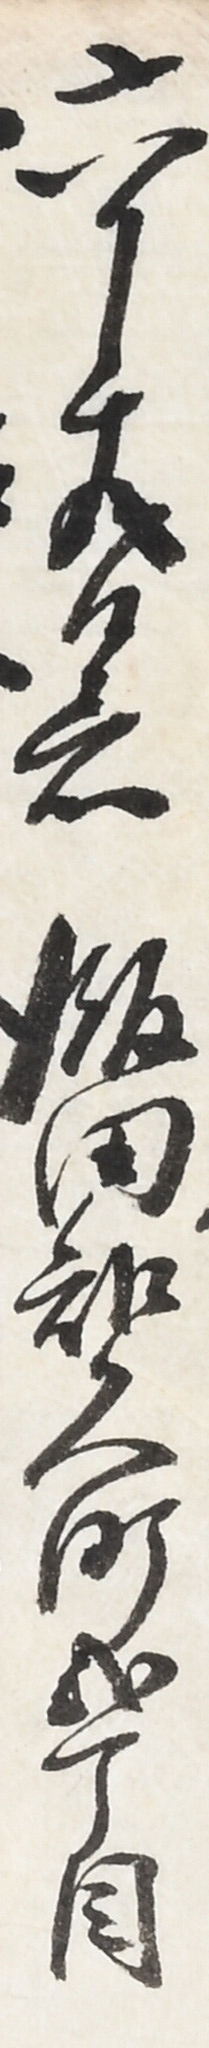六月十九日着飯田知久町弐丁目
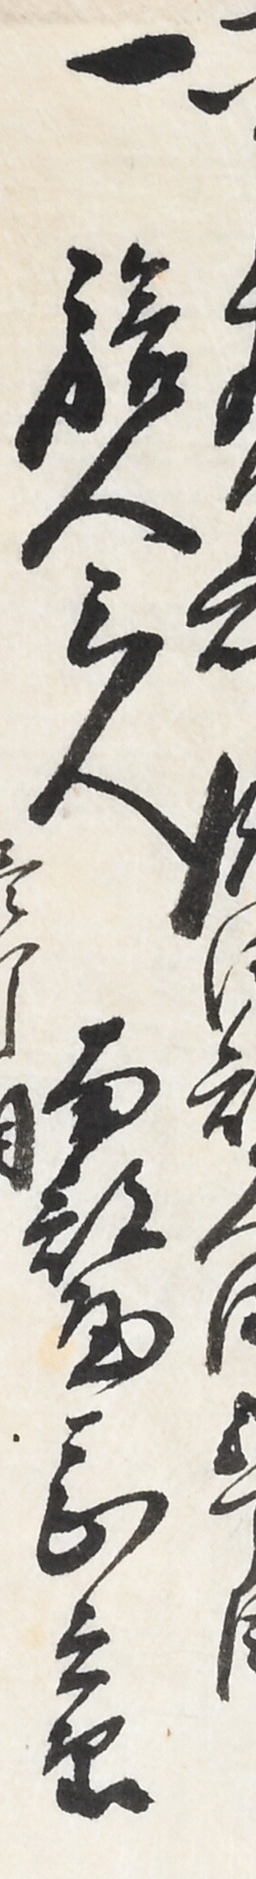一旅人三人南部屋甚兵衛
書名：旅人泊控帳
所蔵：伊那市立高遠町図書館・合同会社AMANE
